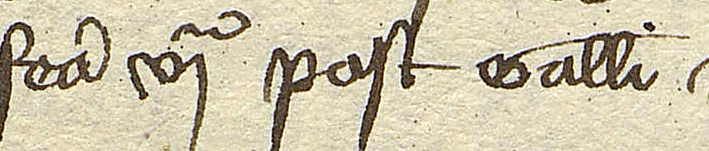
fea* vi* poſt Galli
